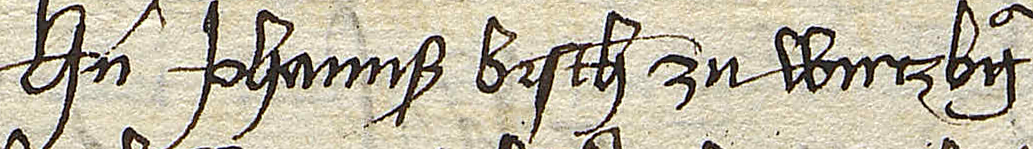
Hn* Iohannſ* biſch* cʒu wircʒb*g
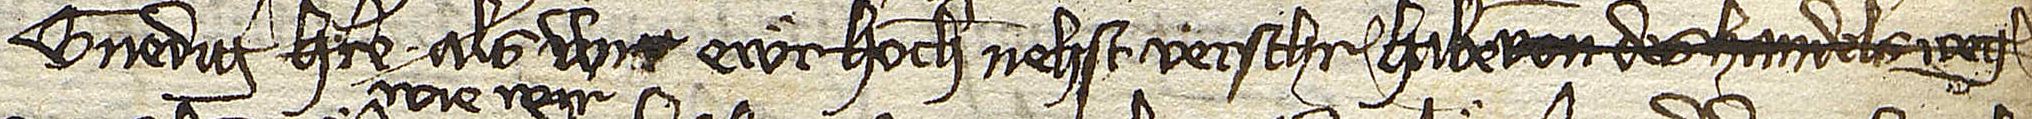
Gnedig* h*re als wir eẅr hoch* nehſt verſchr* habe* von des handels weg*
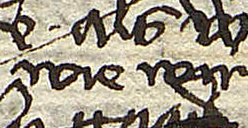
wie wir
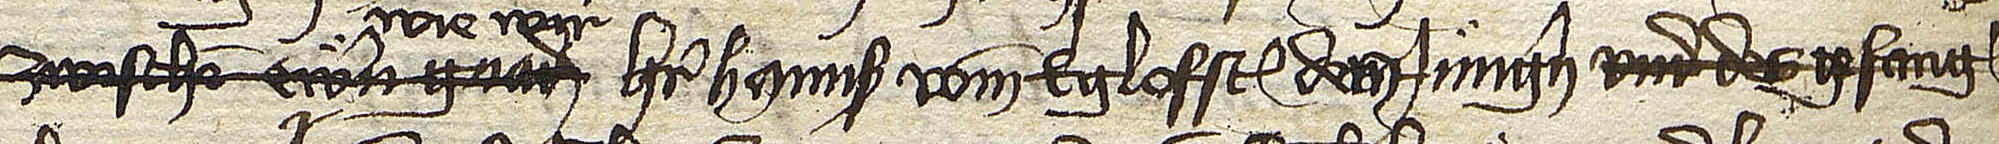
cʒwiſche* eẅ*n gnad* hr* hannſ* vom* Eglofſt* dem Iüng*n vnd des gefang*
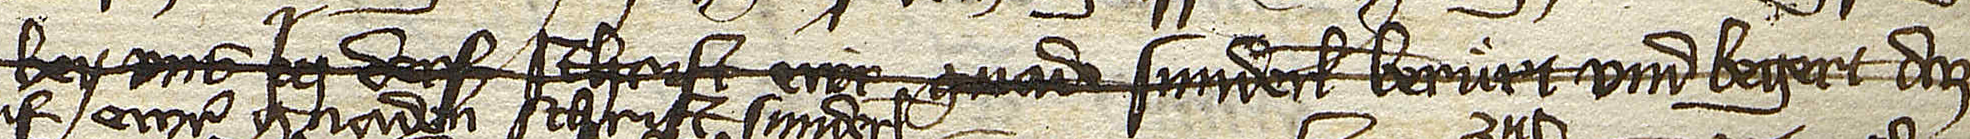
bey vns In derſ* ſchrift eẅr gnade ſunderl* berürt vnd begert daʒ
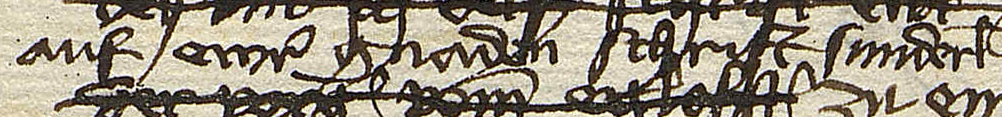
auf ewr* gnaden ſchrift ſunderl*
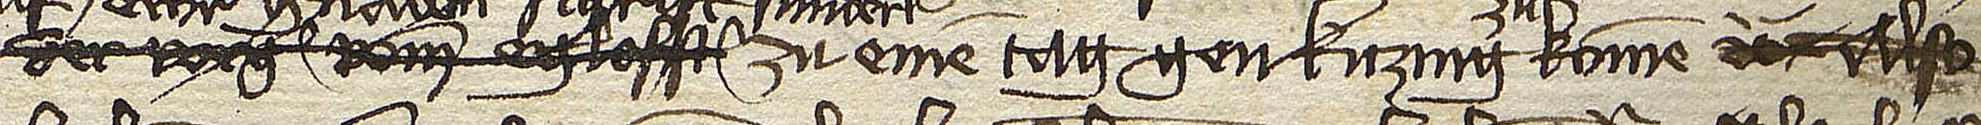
der vorg* vom* eglofſt* ʒu eine* tag gen kicʒing kome* ec* Alſo
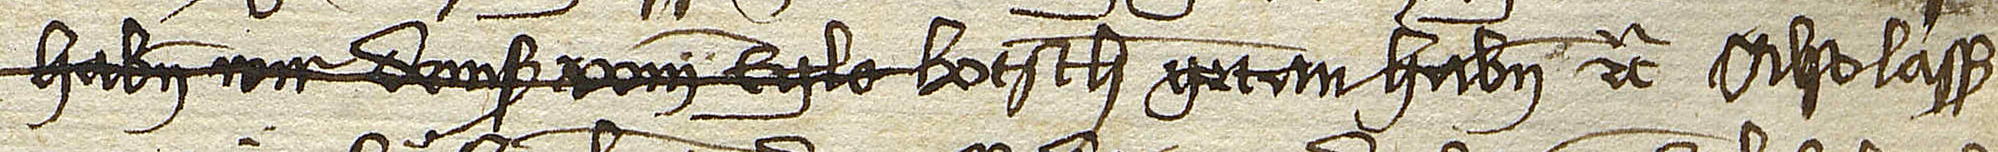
habn* wir demſ* vom* Eglo botſch* getan habn* ec* / Alſo laſſ*
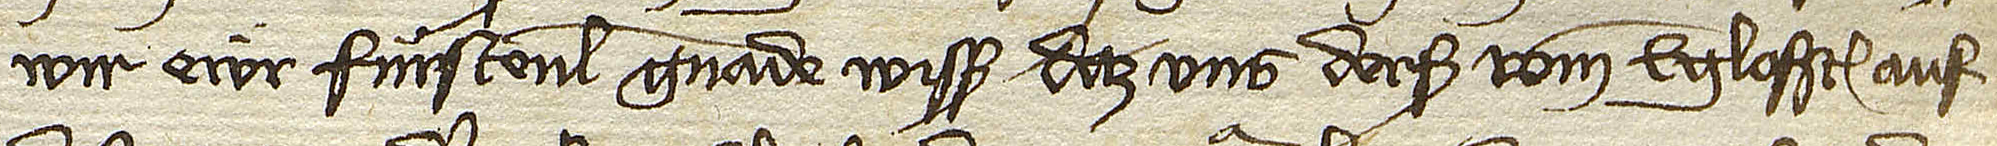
wir eẅr fürſtenl* gnade wiſſ* daʒ vns derſ* vom* Eglofſt* auf
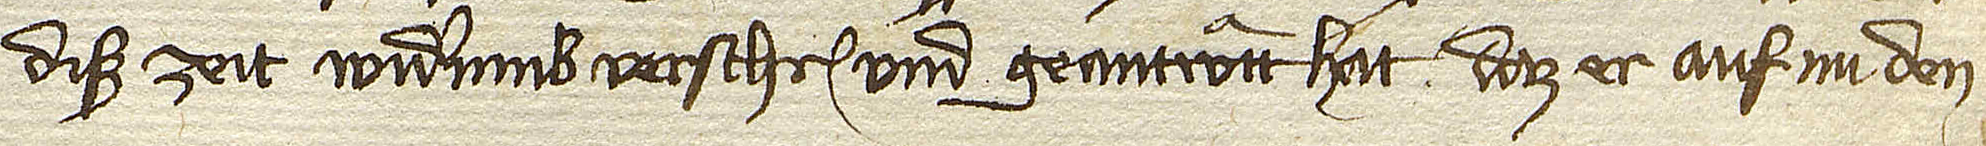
diſʒ ʒeit wid*umb verſchr* vnd geantw*tt hat / daʒ er auf nu den
